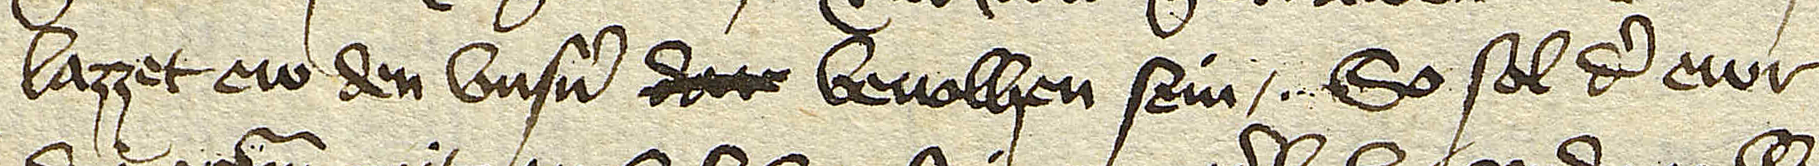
laʒʒet ew den vnſn* dar beuolhen ſein / . So ſol d* ewr
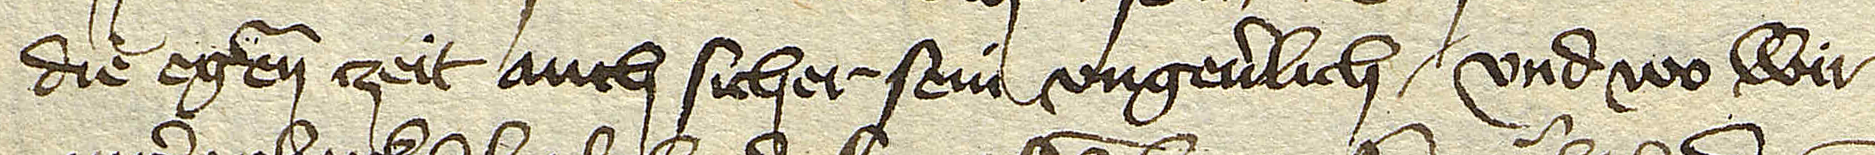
die egen* cʒeit auch ſicher ſein vngeu*lich / vnd wo wir
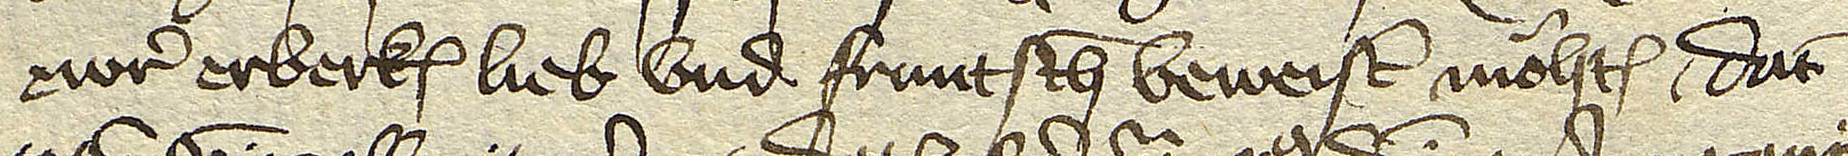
ewr* erberk* lieb vnd fruntſch* beweiſe* möht* / Das
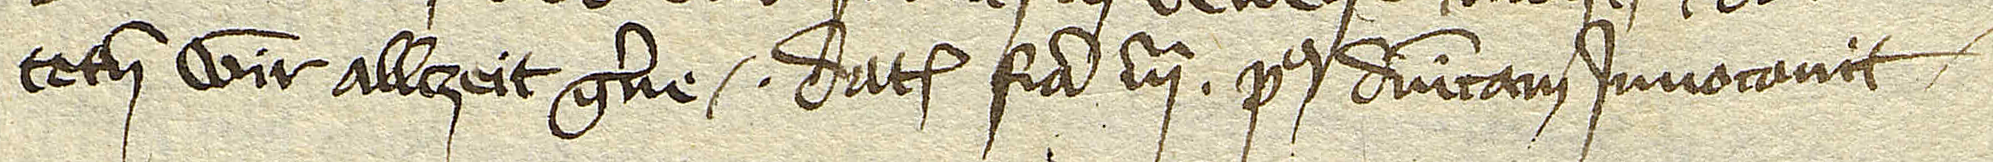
tetn* wir allcʒeit g*ne / . Dat* fia* iii* . p* dni*cam Inuocauit /
